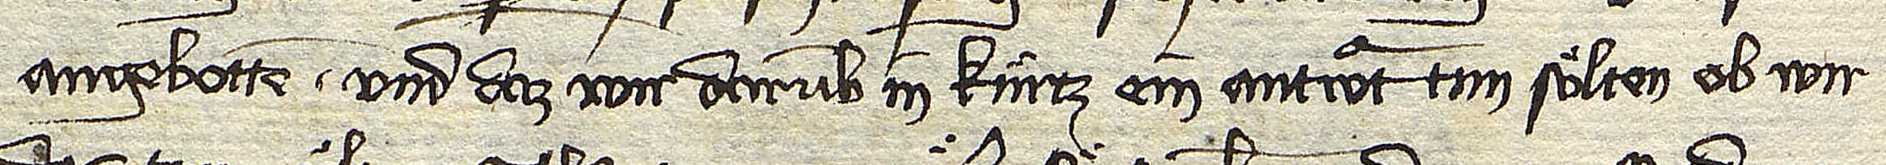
angebotte* . vnd daʒ wir daru*b in kürcʒ ein antw*t tun ſölten ob wir
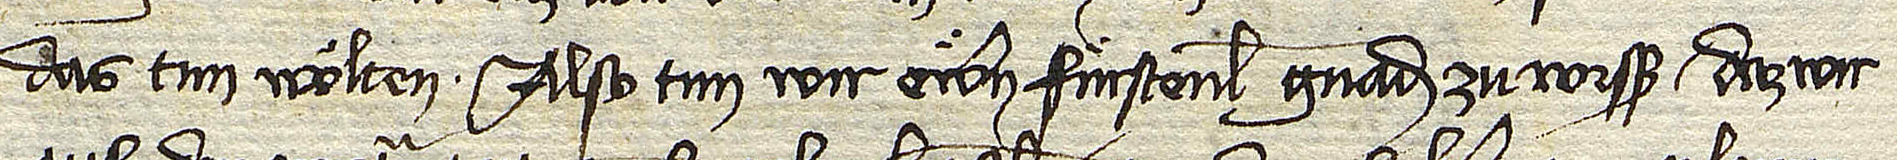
das tun wölten . Alſo tun wir ew*n fürſtenl* gnad* ʒu wiſſ* / daʒ wir
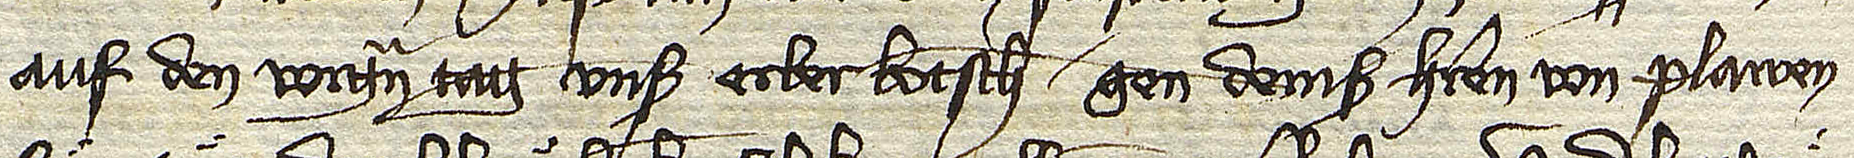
auf den vorg*n tag vnſ* erber botſch* / gen demſ* h*ren von Plawen
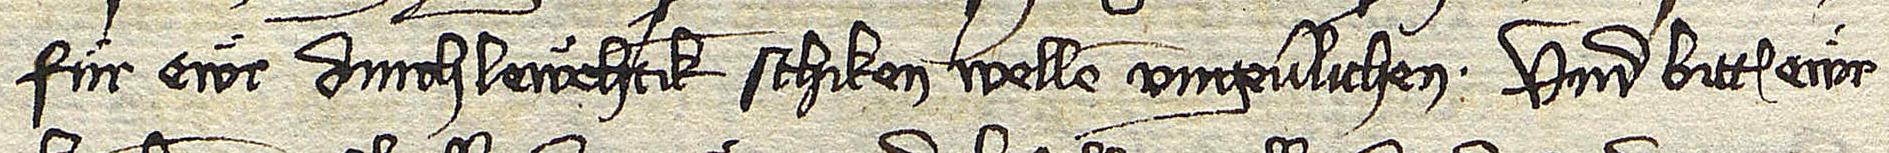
für ewr durchlewchtik* ſchiken welle* vngeu*lichen . Vnd bitt* ewr
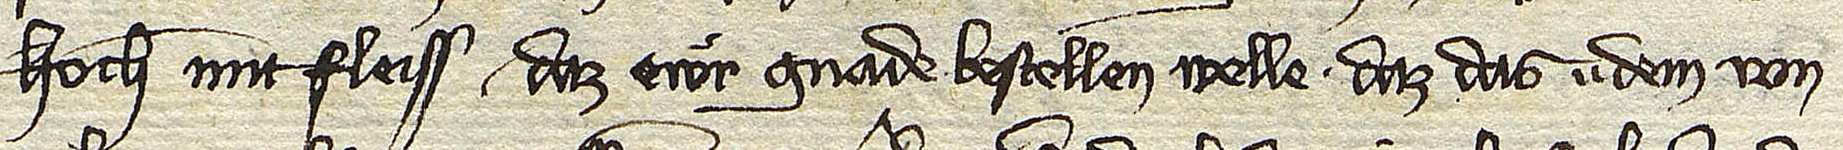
hoch* mit fleiſſ / daʒ ewr gnade beſtellen welle . daʒ das ~ dem von
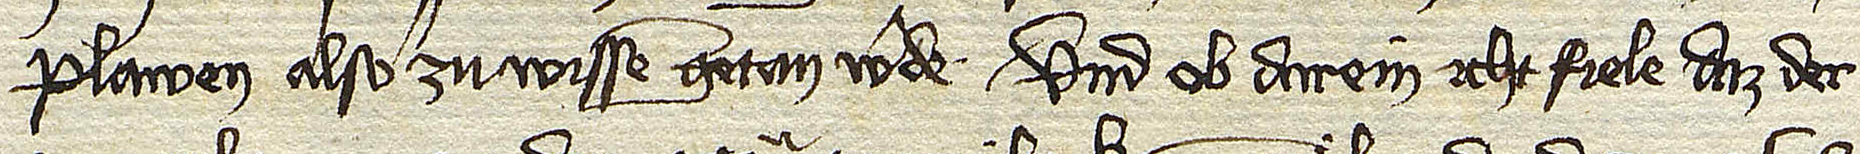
Plawen alſo ʒu wiſſe* getan w*de . / Vnd ob darein icht fiele daʒ der
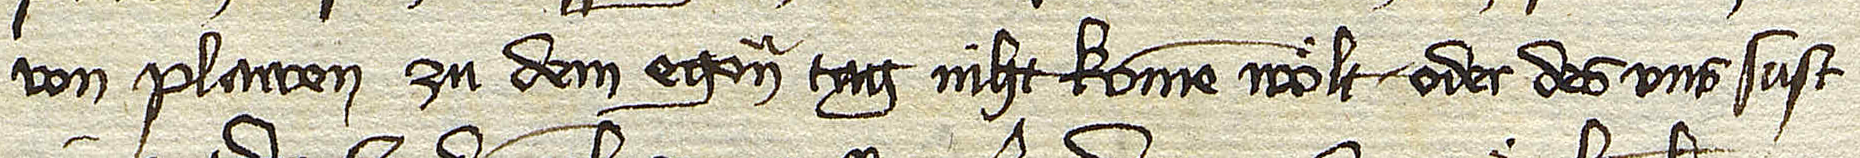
von plawen ʒu dem ege*n tag niht kome* wölt / oder des vns ſuſt
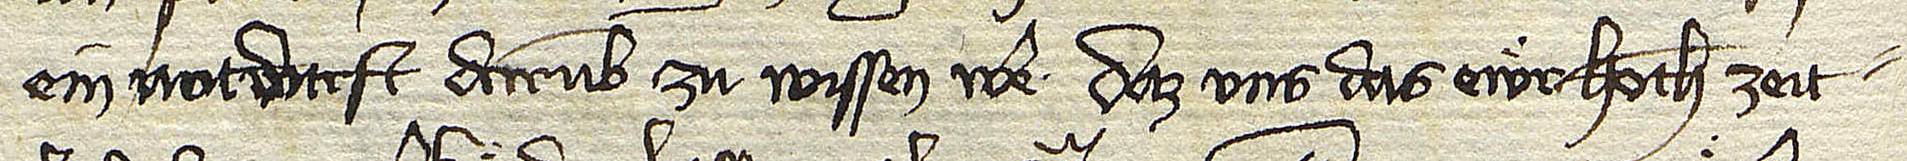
ein notdruft daru*b ʒu wiſſen we* . Daʒ vns das ewr hoch* ʒeit =
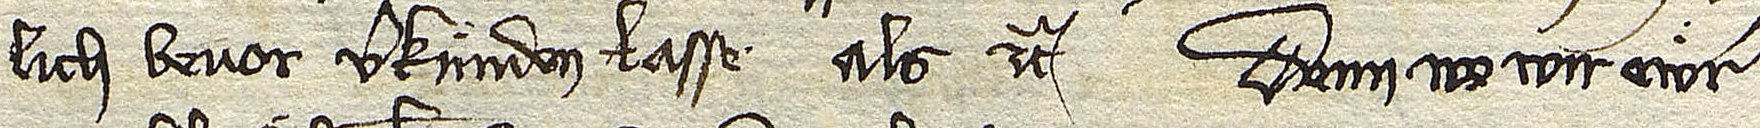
lich beuor v*künden laſſe . als ec* Denn wo wir ew*r
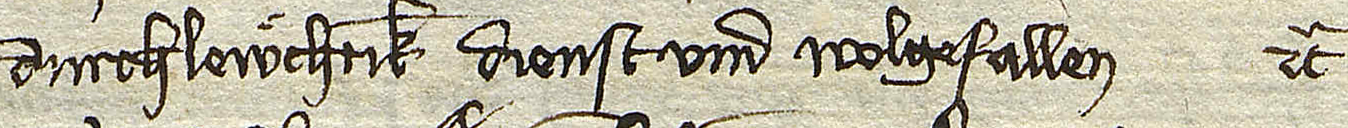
durchlewchtik* dienſt vnd wolgefallen ec*
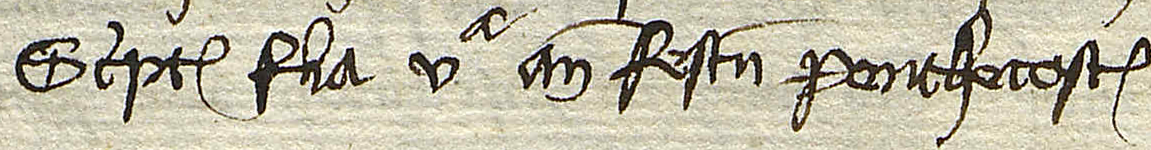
Sc*pt* fia* v* an* feſtu* Penthecoſt*
